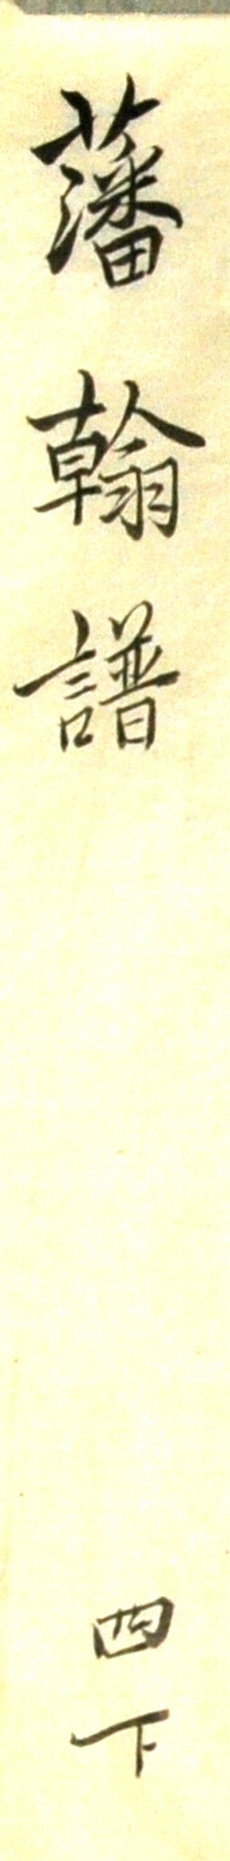藩翰譜四下

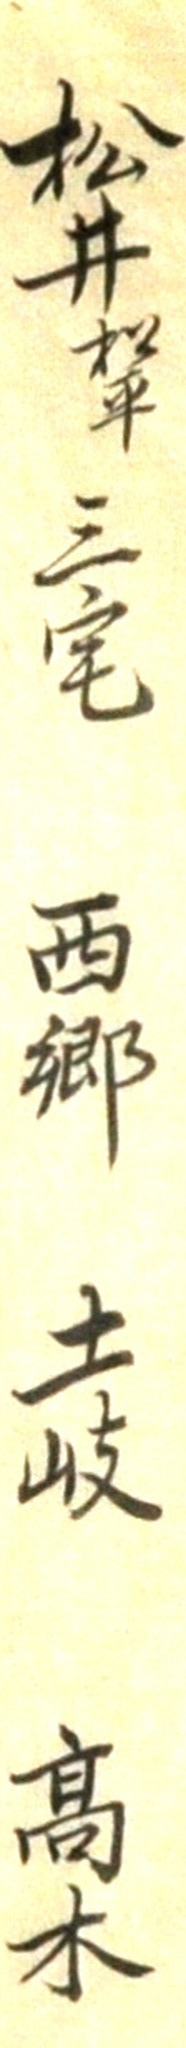松井松平三宅西郷土岐高木
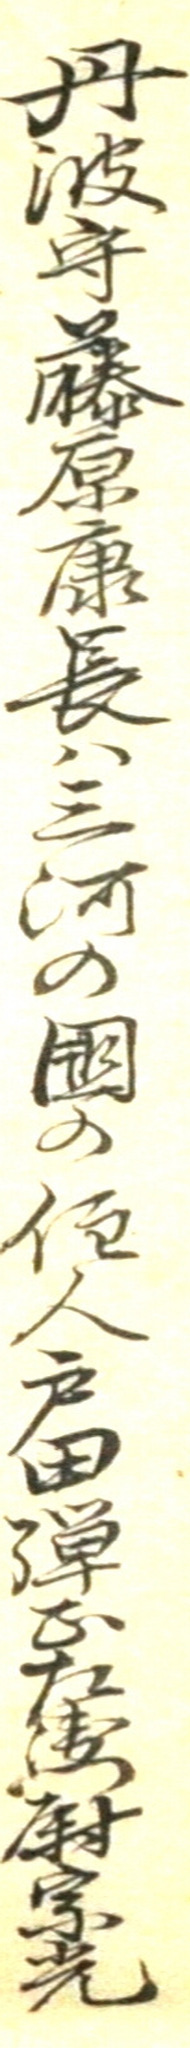丹波守藤原康長は三河の国の住人戸田弾正左衛門尉宗光
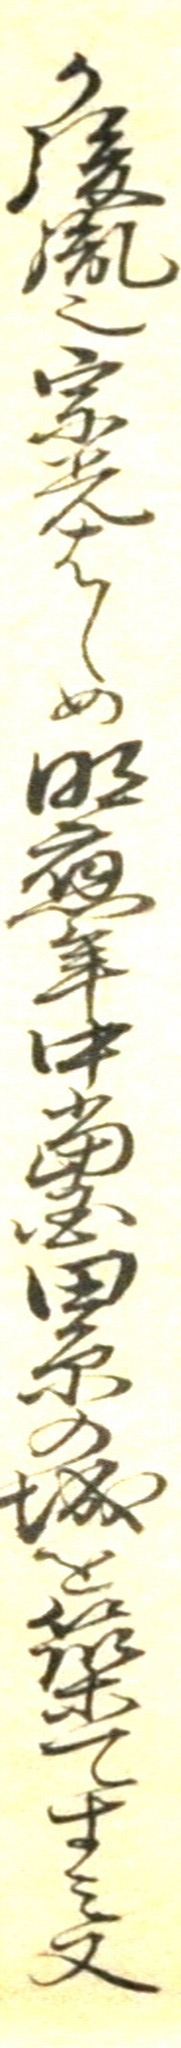か後胤也宗光はしめ明応年中当国田原の城を築てすみ又

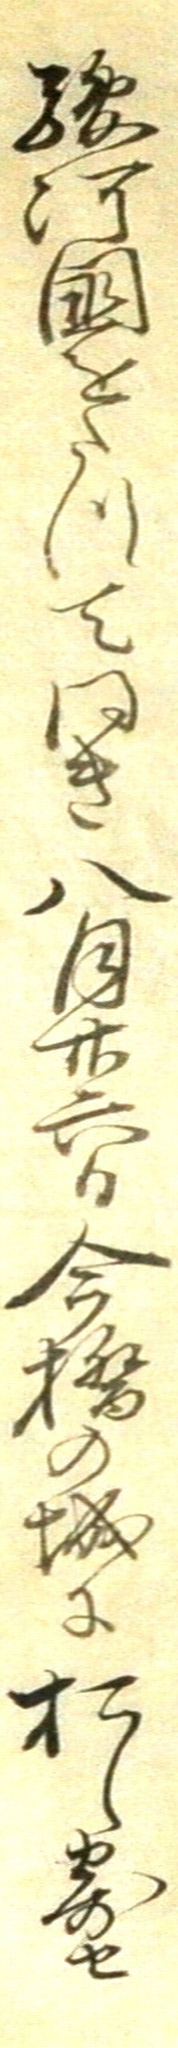駿河国をたつて同き八月廿六日今橋の城におし寄せ
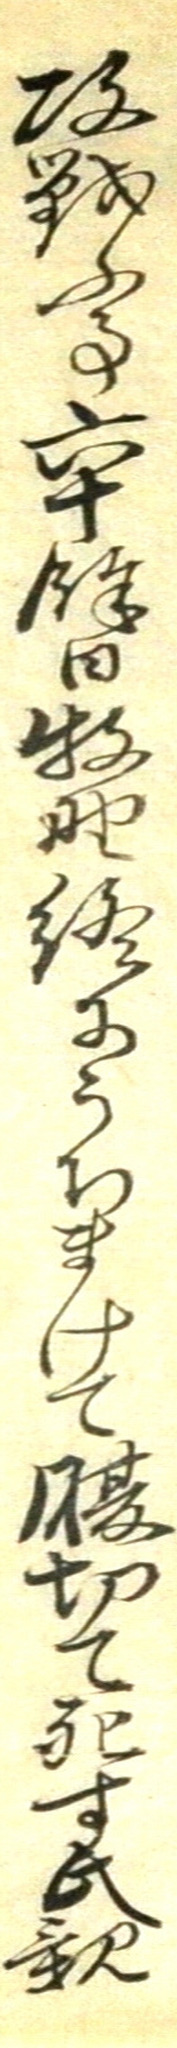攻戦ふ事六十余日牧野終にうちまけて腹切て死す氏親
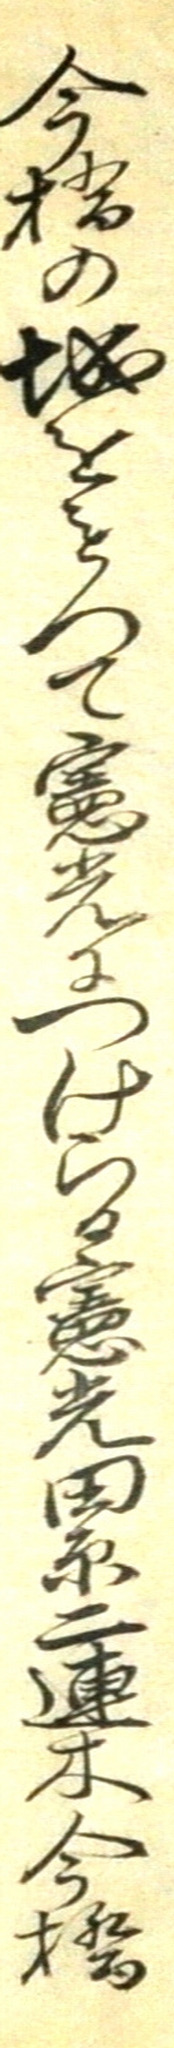今橋の城をもつて憲光につけらる憲光田原二連木今橋
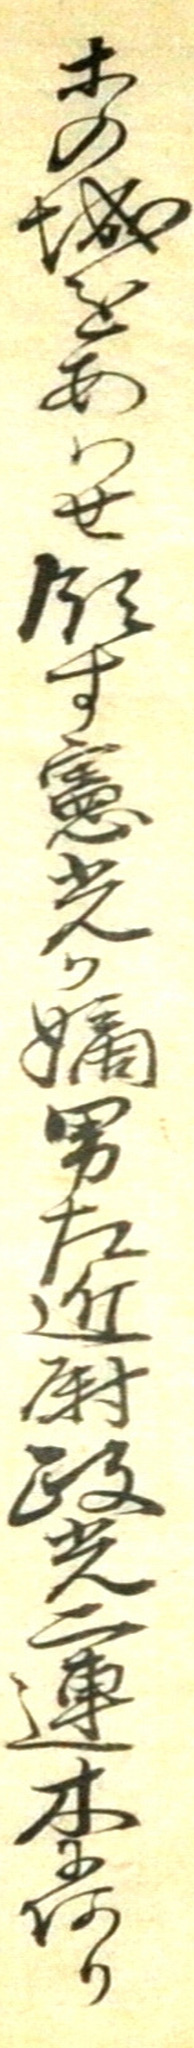等の城をあわせ領す憲光か嫡男左近尉政光二連木にあり
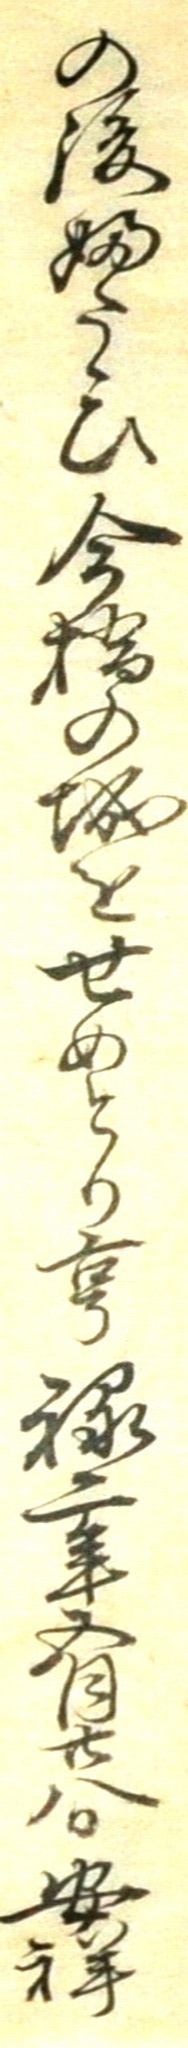の後ふたゝひ今橋の城をせめとり享禄二年五月廿八日安祥
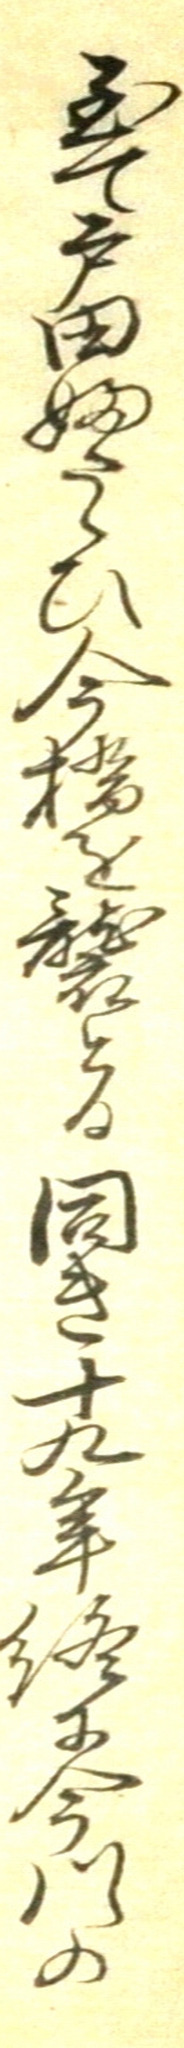至て戸田ふたゝひ今橋を襲とる同き十九年終に今川の
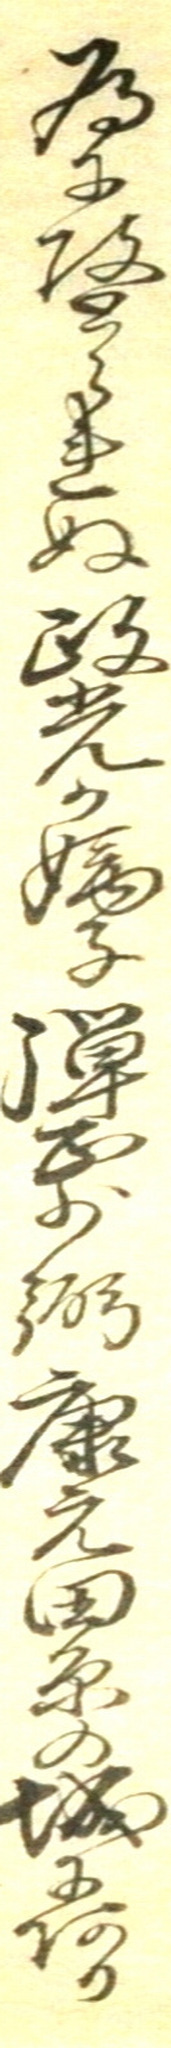為に攻とられぬ政光か嫡子弾正少弼康元田原の城にあり

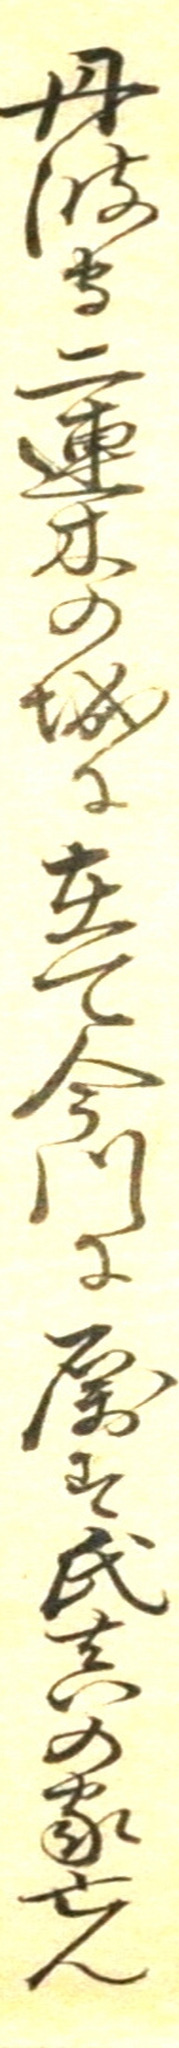丹波守二連木の城に在て今川に属す氏真の家亡ん
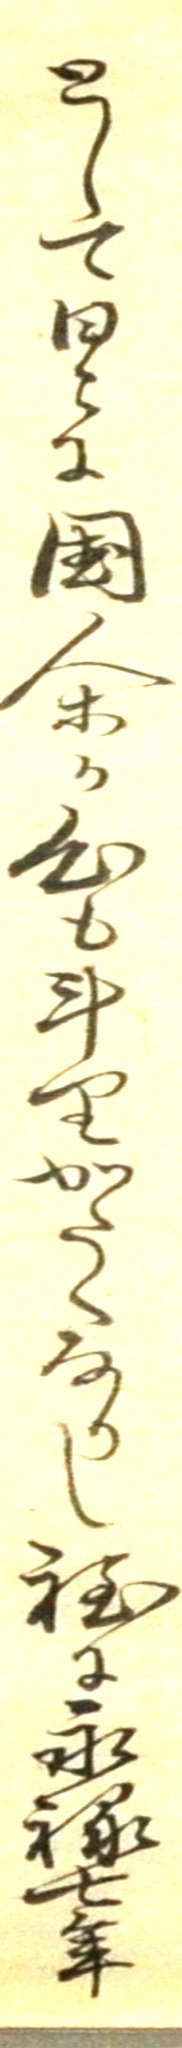として日々に国人等か心も計りかたくなりし程に永禄七年
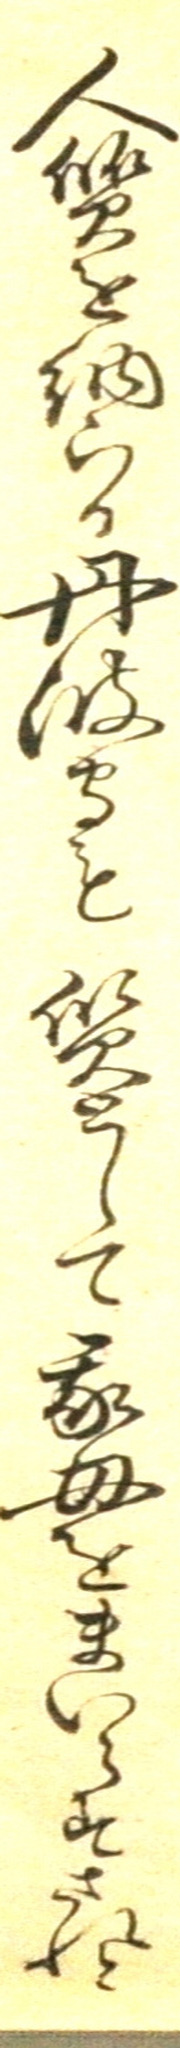人質を納らる丹波守も質として我母をまいらすされと
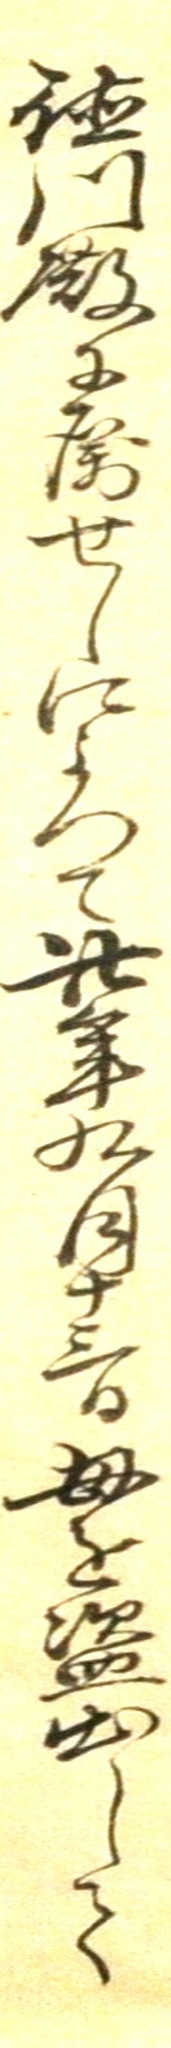徳川殿に属せしによつて廿年九月十三日母を盗出して
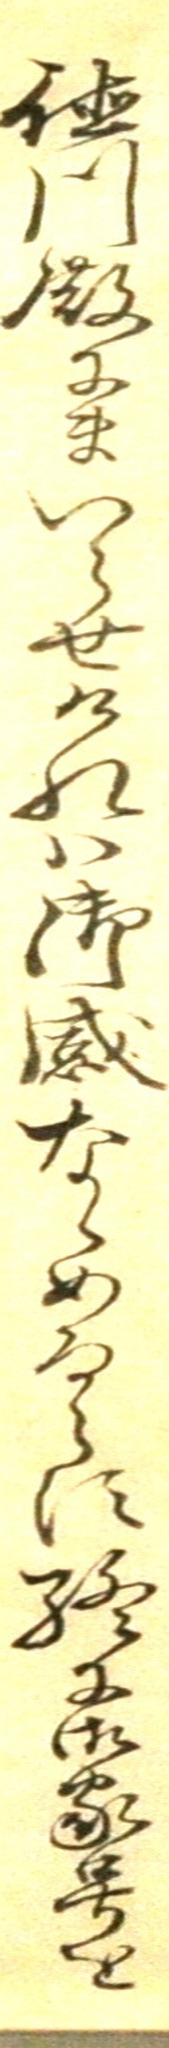徳川殿にまいらせけれは御感なゝめならす終に御家号を
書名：藩翰譜（四・下）
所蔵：伊那市立高遠町図書館・合同会社AMANE
